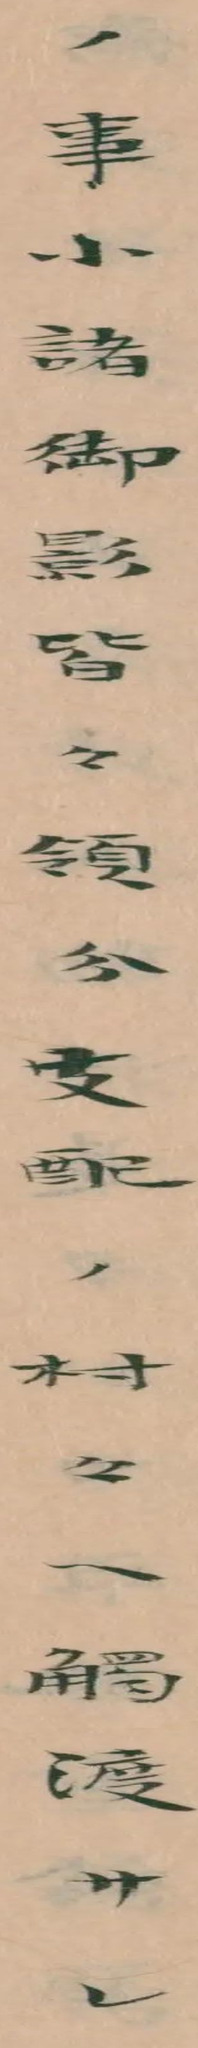ノ事小諸御影皆々領分支配ノ村々へ触渡サレ
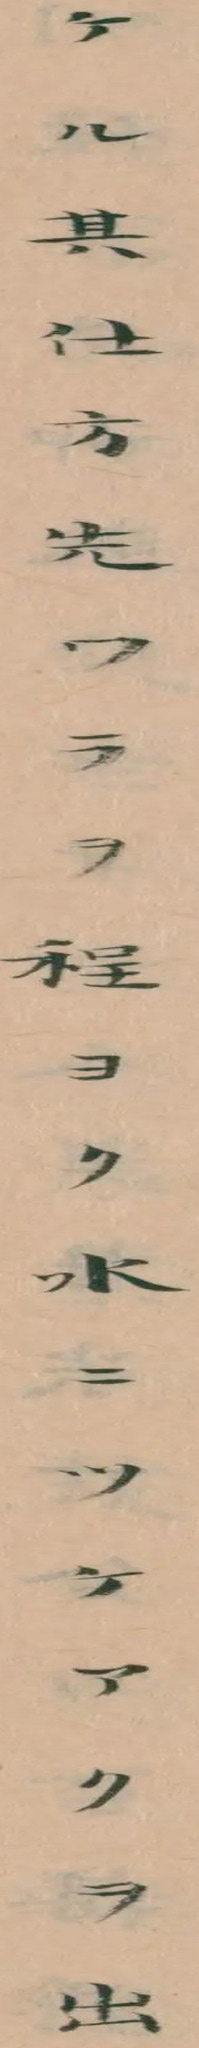ケル其仕方先ワラヲ程ヨク水二ツケアクヲ出
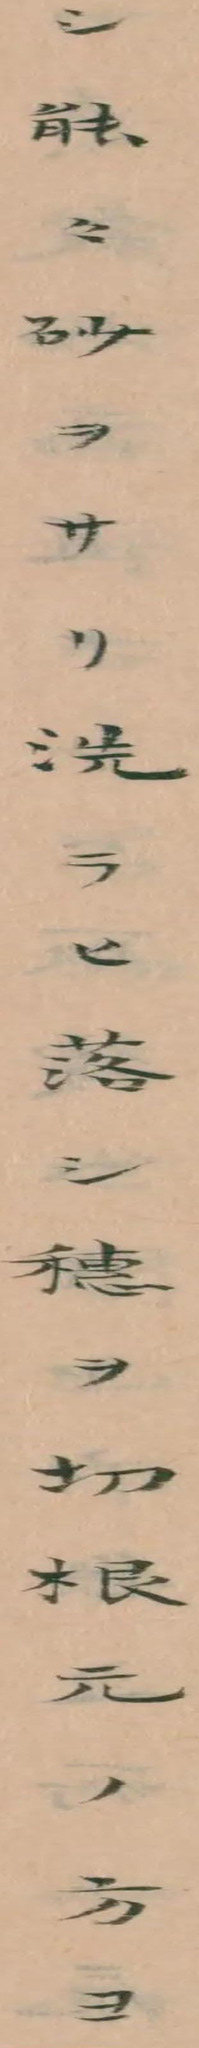シ能々砂ヲサリ洗ラヒ落シ穂ヲ切根本ノ方ヨ
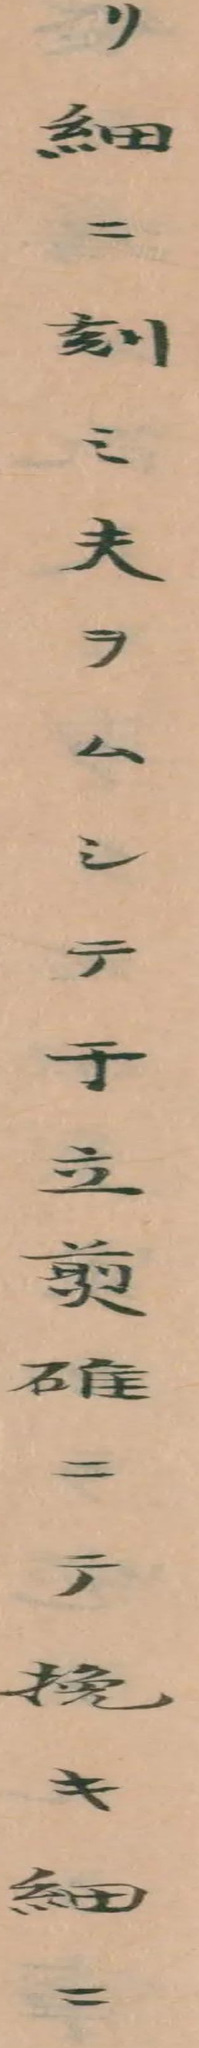リ細二刻ミ夫ヲムシテ干立煎碓ニテ挽キ細二
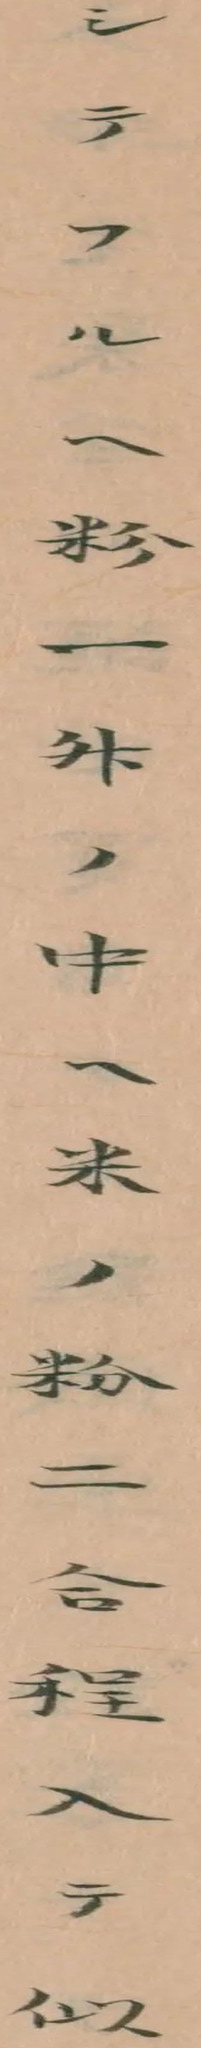シテフルへ粉一升ノ中へ米ノ粉二合程入テ似
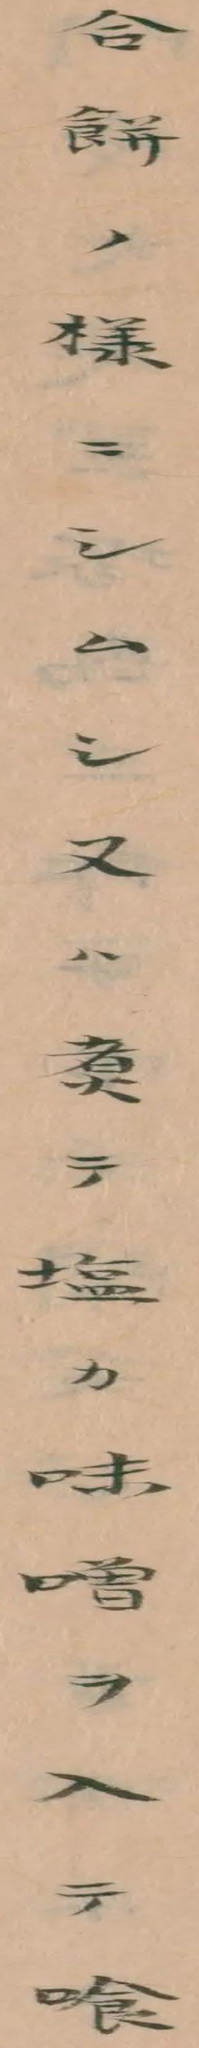合餅ノ様二シムシ又ハ煮テ塩カ味噌ヲ入テ喰
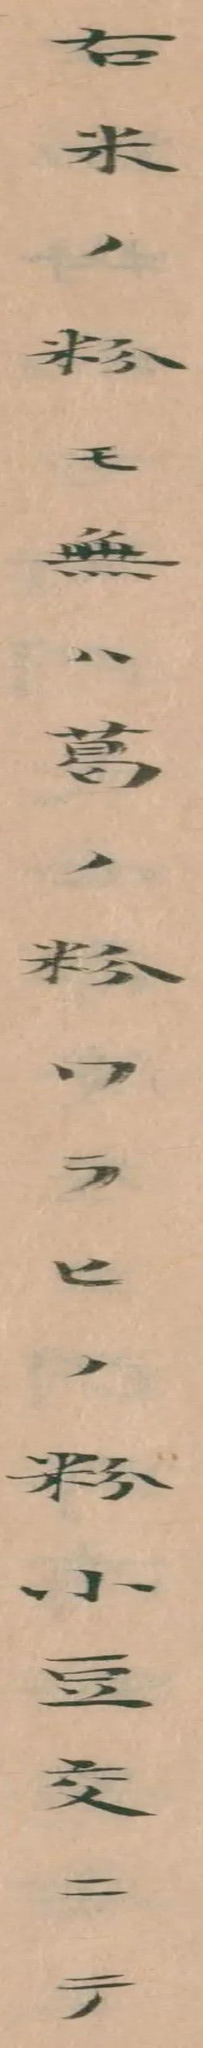右米ノ粉モ無ハ葛ノ粉ワラヒノ粉小豆交ニテ
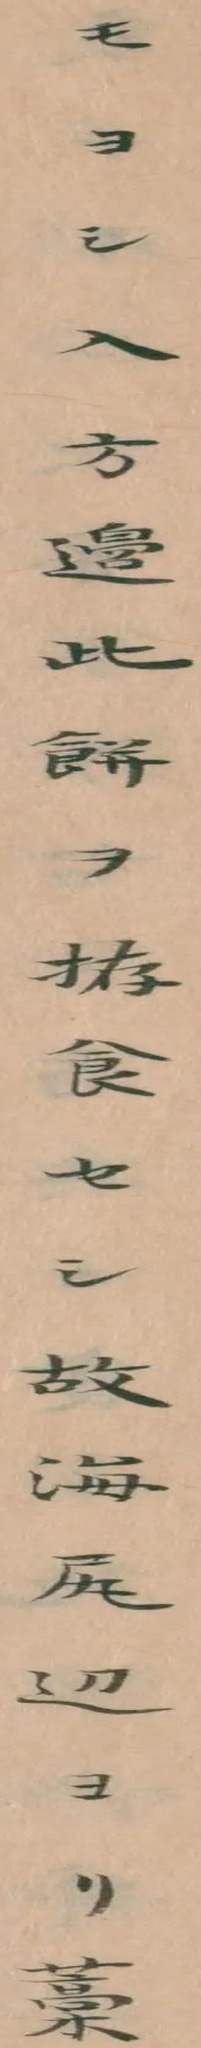モヨシ入方辺此餅ヲ拵食セシ故海尻辺ヨリ藁
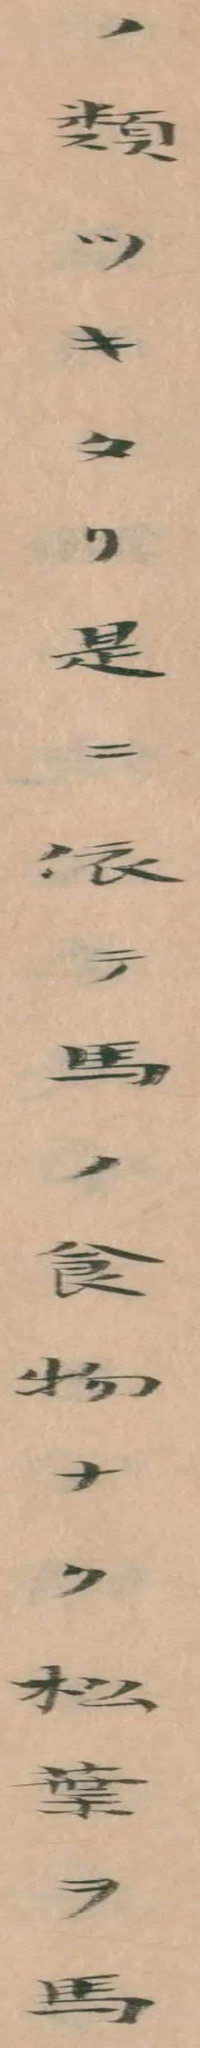ノ類ツキタリ是二依テ馬ノ食物ナク松葉ヲ馬
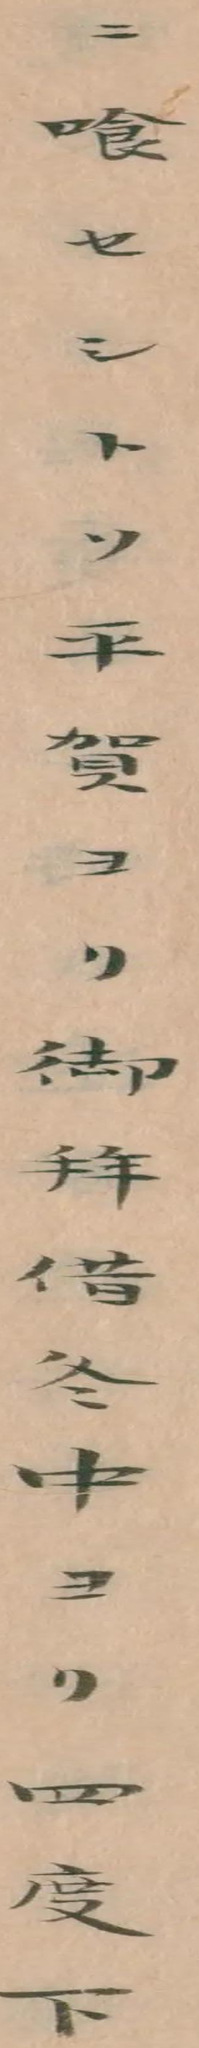二喰セシトソ平賀ヨリ御拝借冬中ヨリ四度下
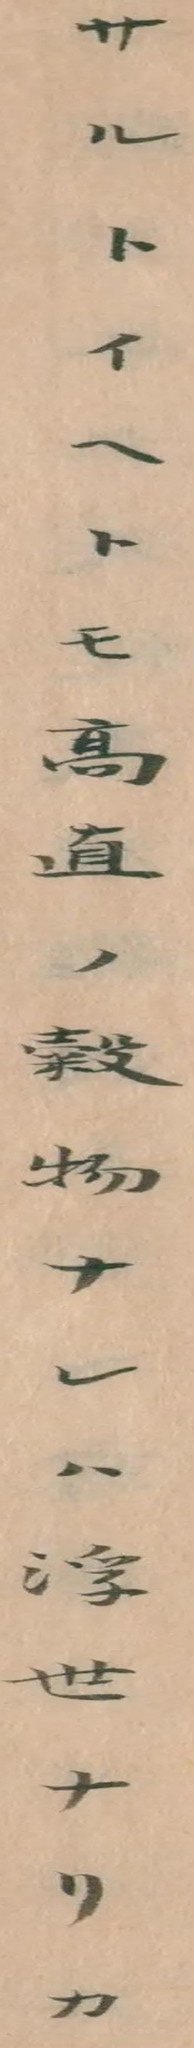サルトイへトモ高直ノ穀物ナレハ浮世ナリカ
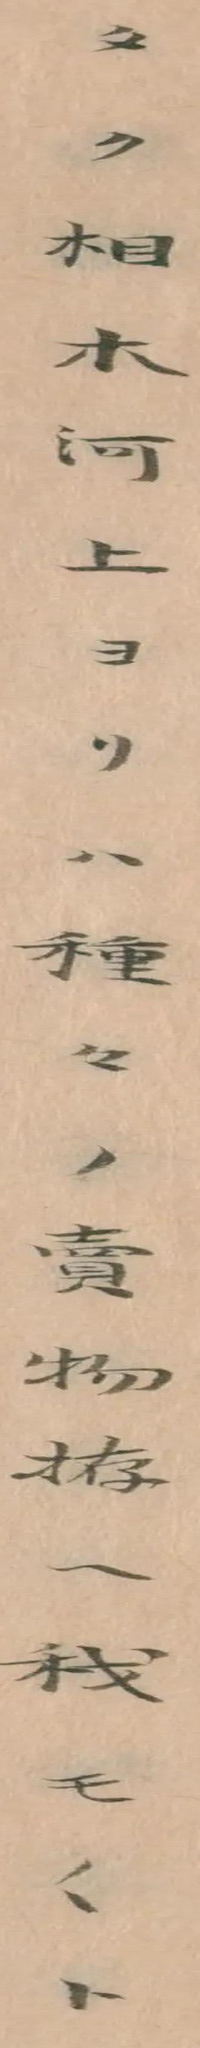タク相木河上ヨリハ種々ノ売物拵ヘ我モ〳〵ト
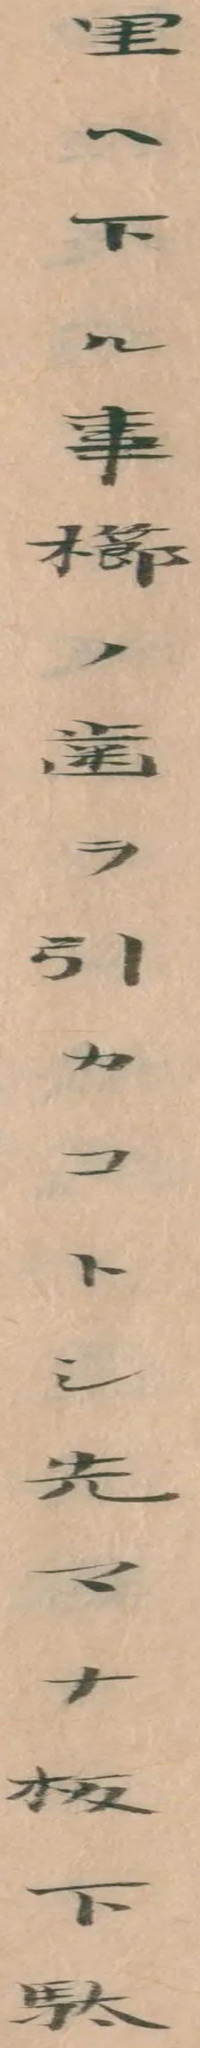里へ下ル事櫛ノ歯ヲ引カコトシ先マナ板下駄

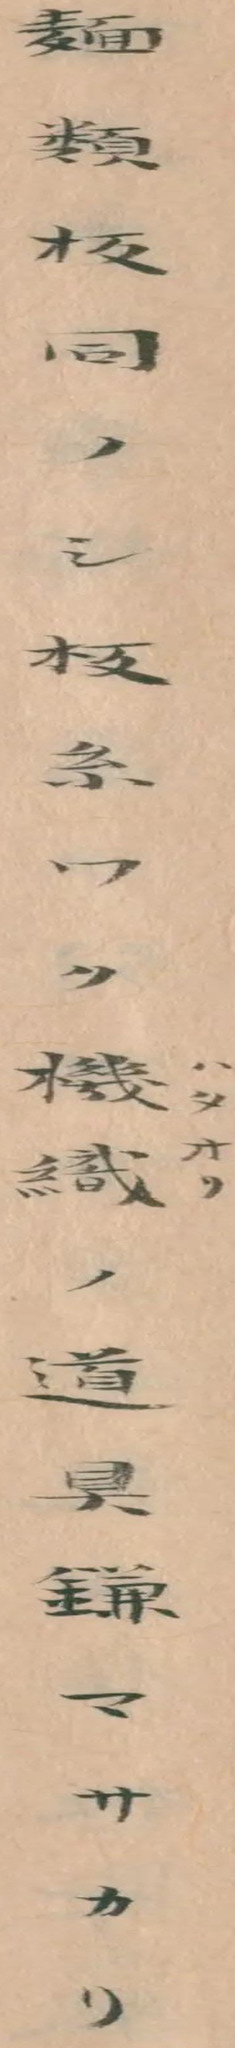麺類板同ノシ板糸ワク機織ノ道具鎌マサカリ
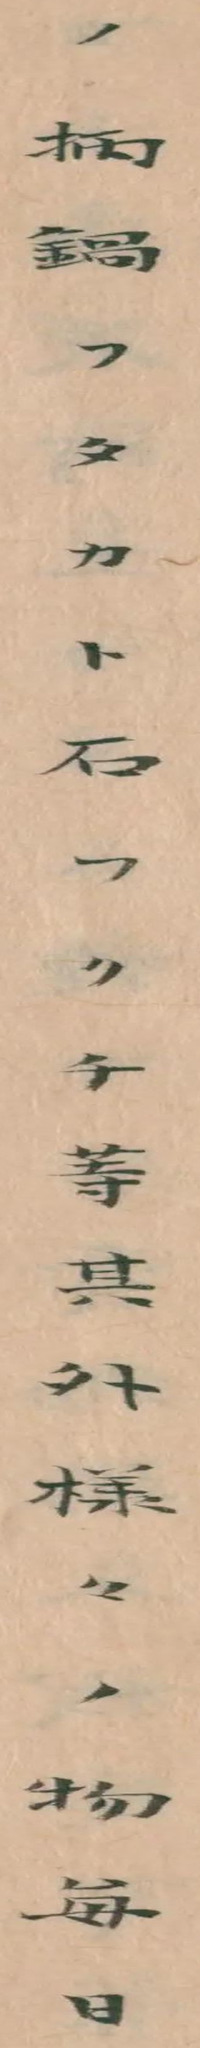ノ柄鍋フタカト石フクチ等其外様々ノ物毎日
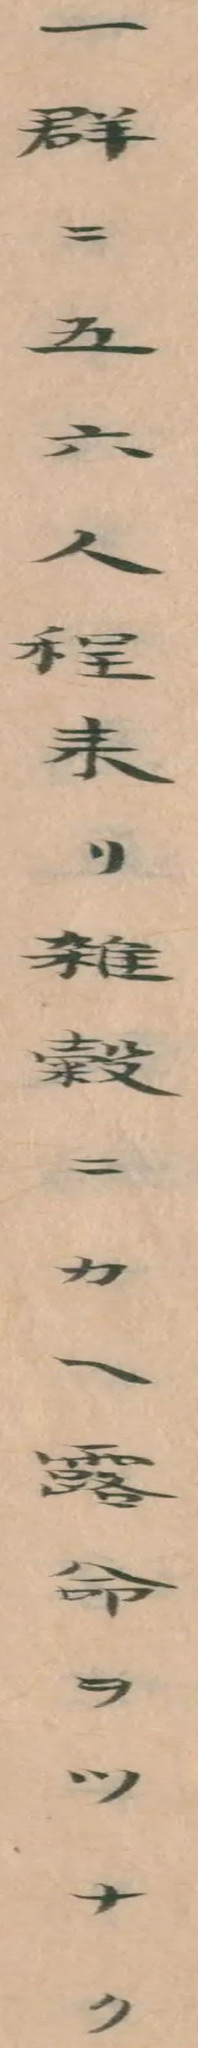一群二五六人程来り雑穀二カへ露命ヲツナク
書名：地災撮要. 巻3(地震之部)-巻4(噴火之部)
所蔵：国立国会図書館 National Diet Library, JAPAN
